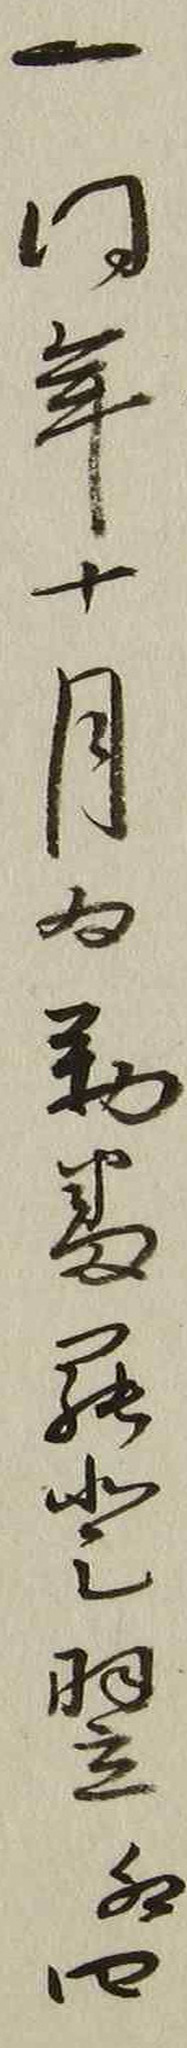一同年十月為勤番罷登翌卯四
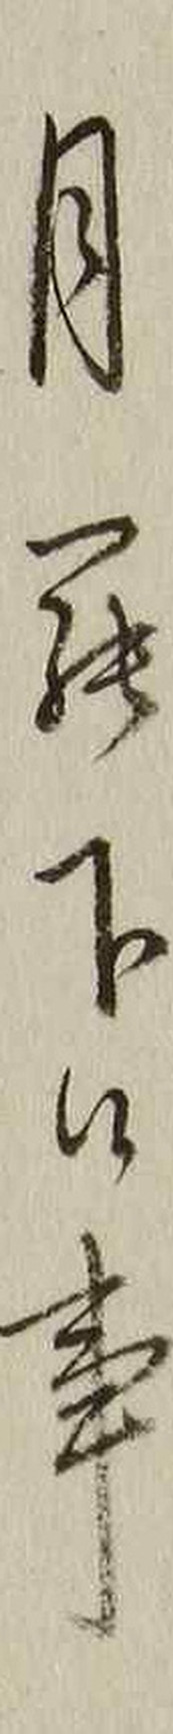月罷下候事
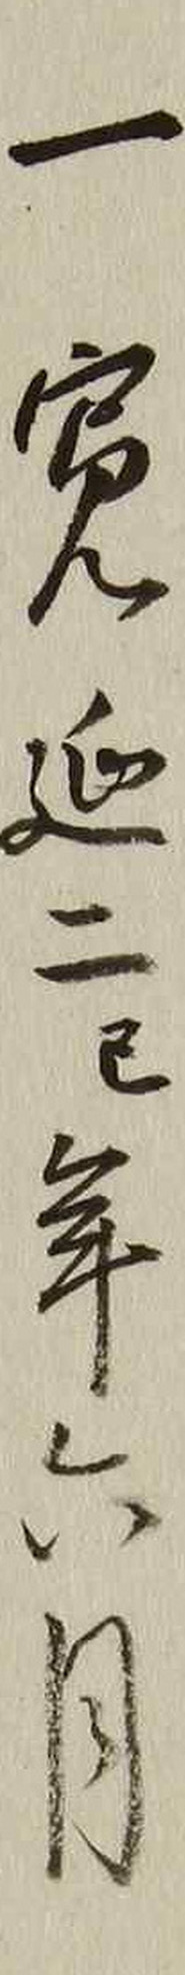一寛延二巳年六月
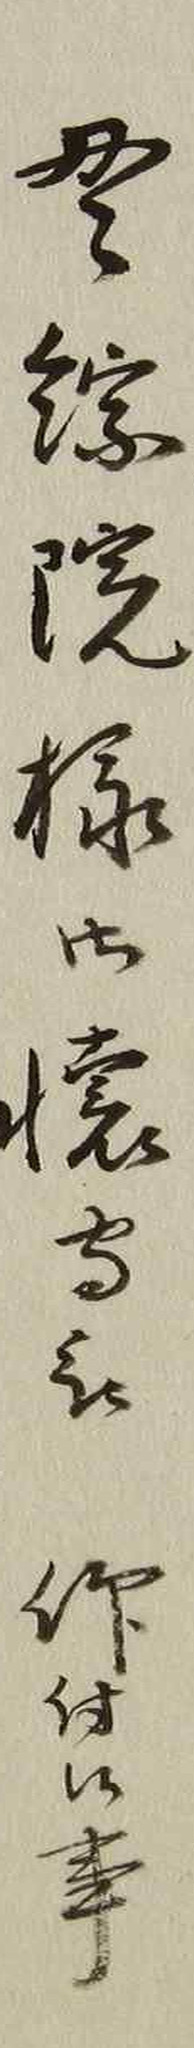貫綜院様御懐守被仰付候事
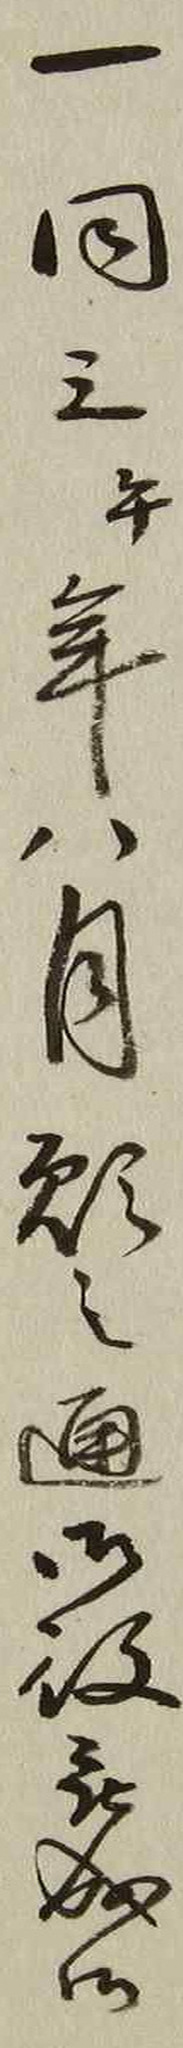一同三午年八月願之通御役被成御
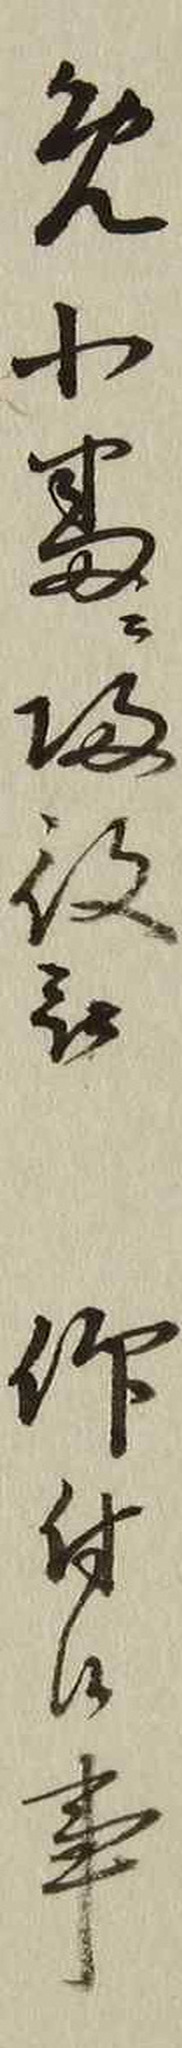免小番ニ帰役被仰付候事
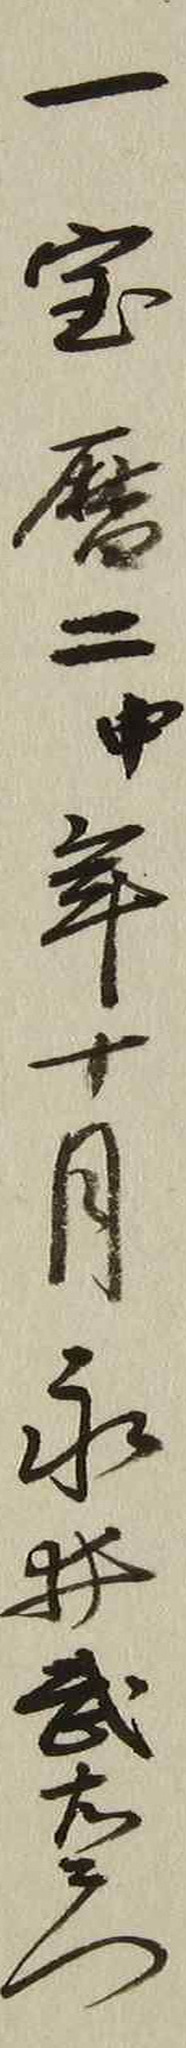一宝暦二申年十月永井武右エ門
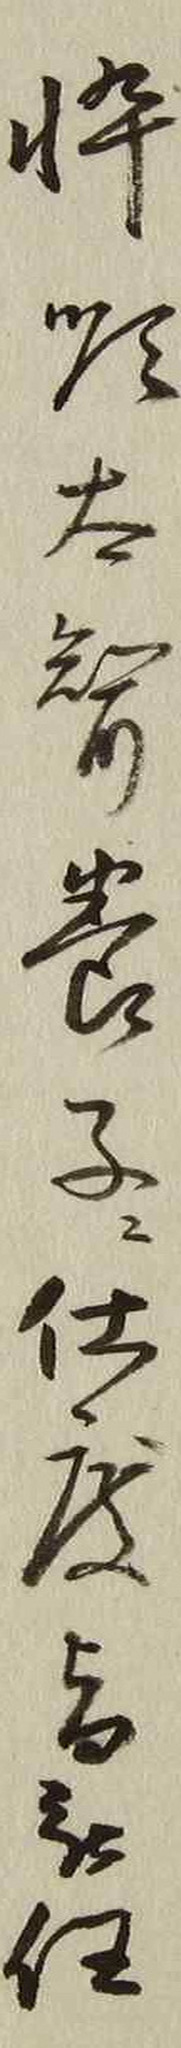忰順太婿養子ニ仕度旨被任
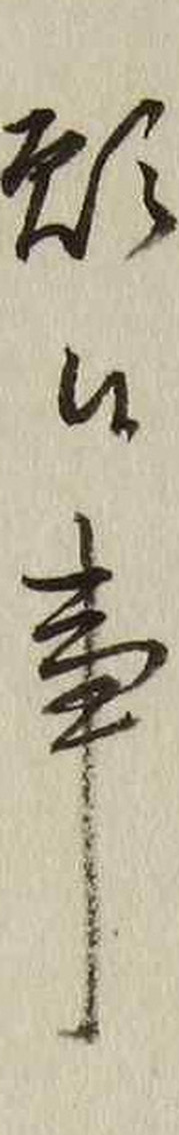願候事
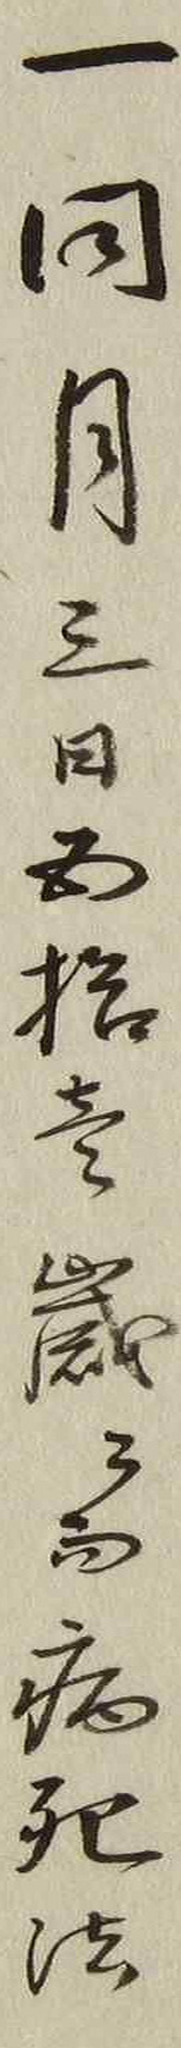一同月三日五拾壱歳ニ而病死法
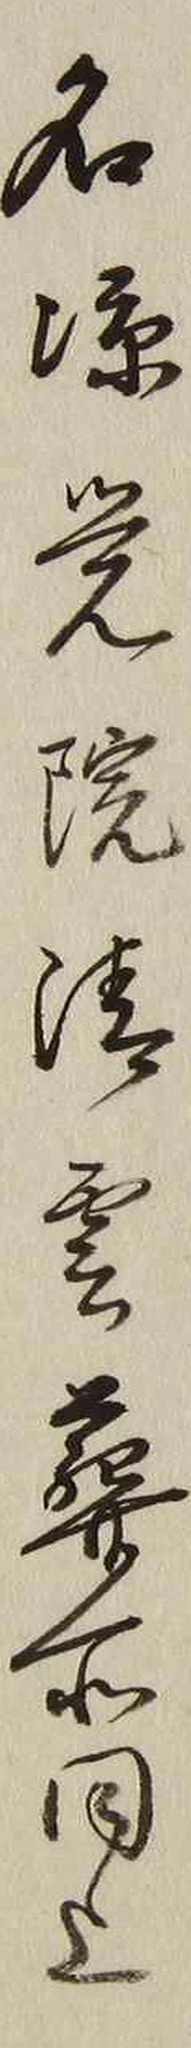名涼覚院清雲葬所同上
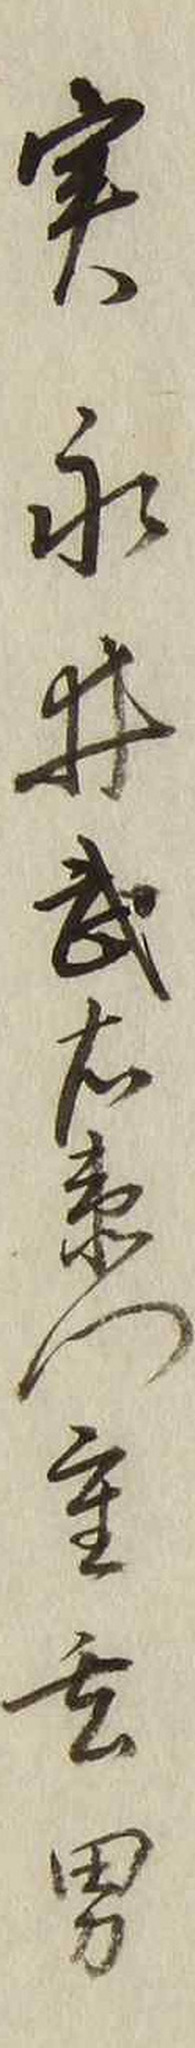実永井武右衛門重玄男

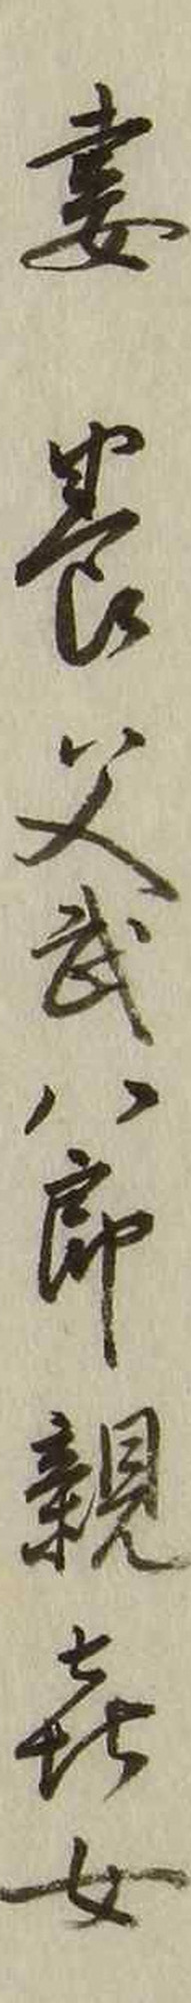妻養父武八郎親喜女
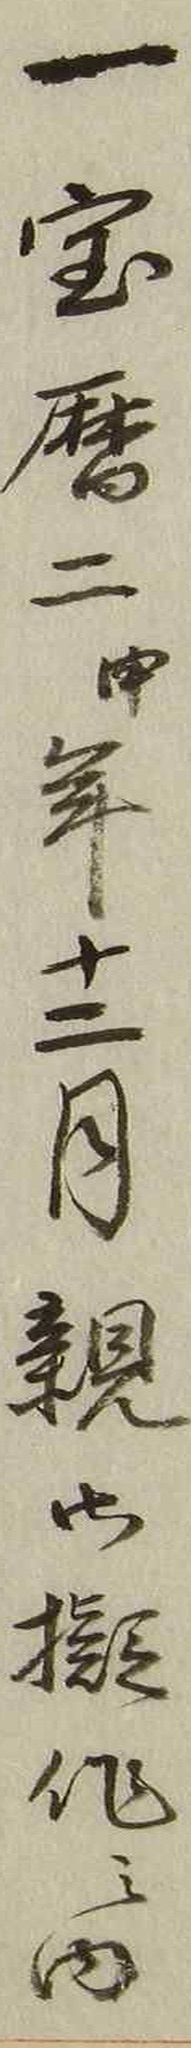一宝暦二申年十二月親御擬作之内
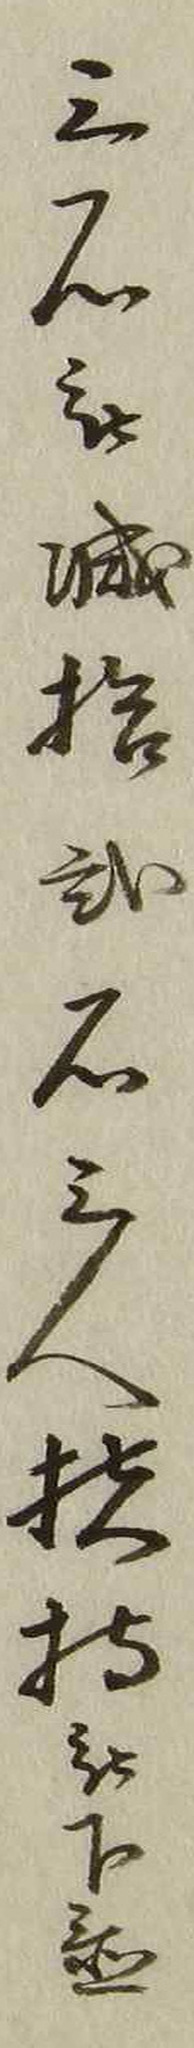三石被減拾弐石三人扶持被下置
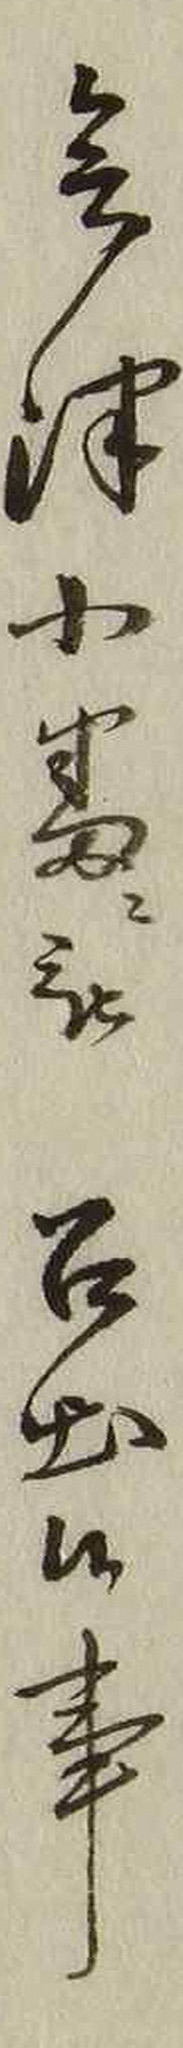会津小番ニ被召出候事
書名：諸士系譜　巻之149　そ之部2
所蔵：会津若松市立会津図書館
